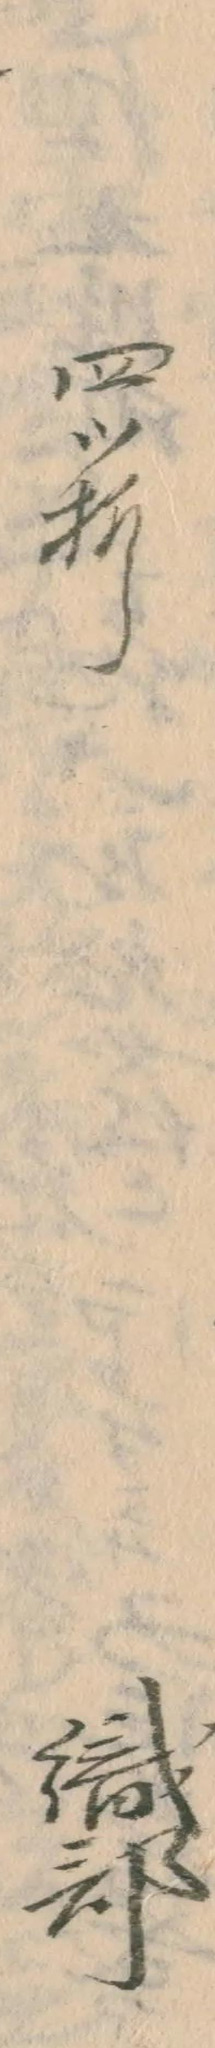四ツ折織部
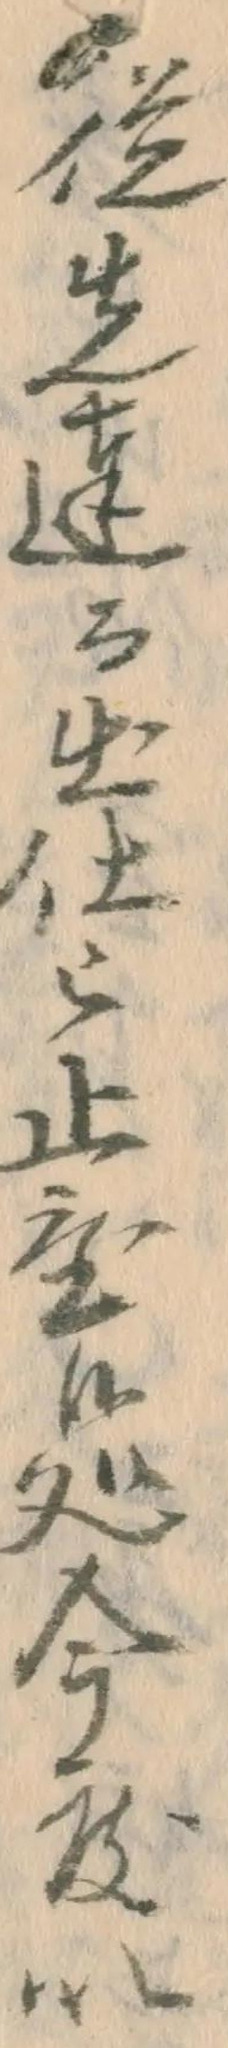従先達而出仕被止置候処今度以
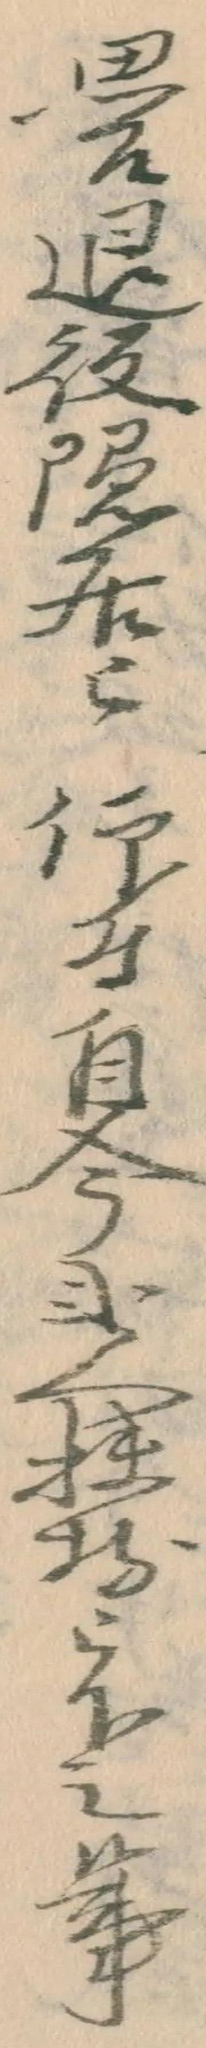思召退役隠居被仰付自今弐人扶持被下之候事
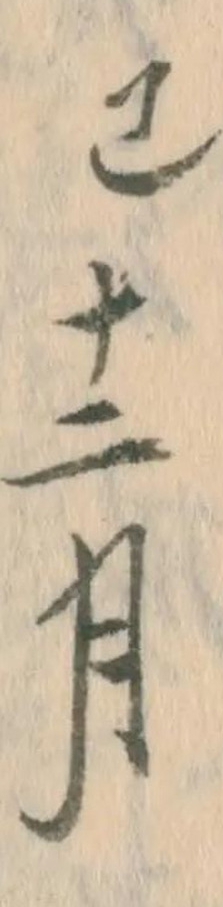己十二月
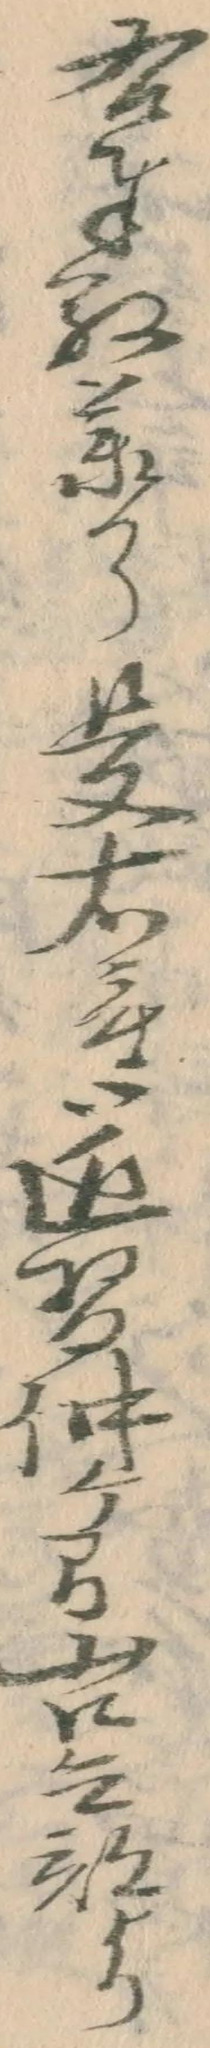右奉敬承了且又右ニ付御近習仲ヶ間山口兵部より
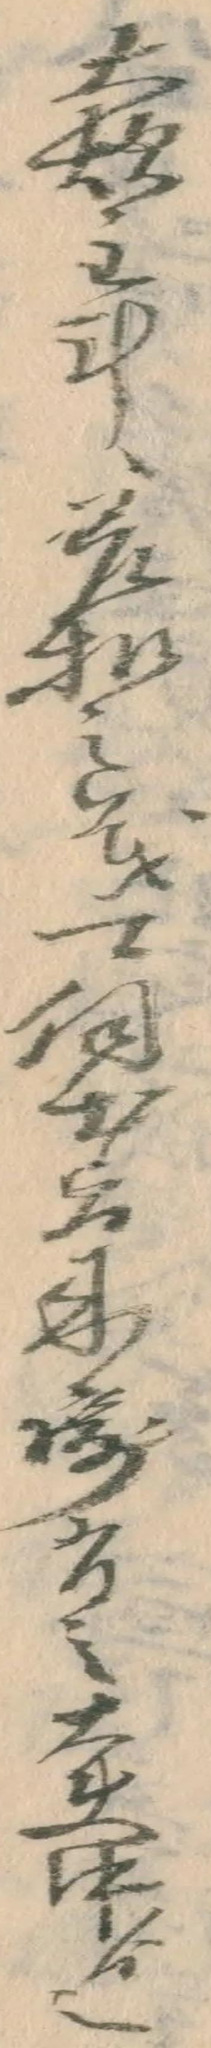大炊主斗ヘ差扣之義可伺出旨来揃有之大夫中ゟ之
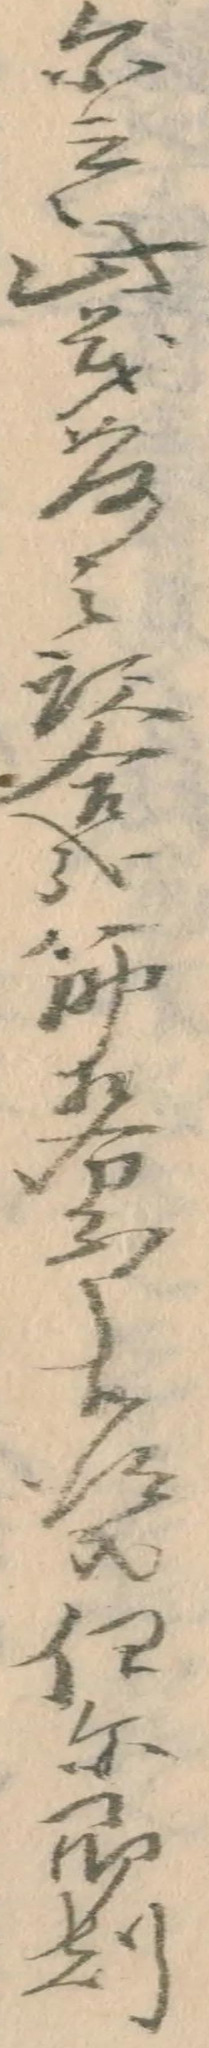示云々此義如何之訳合哉筋相分不申候得共任尓即刻
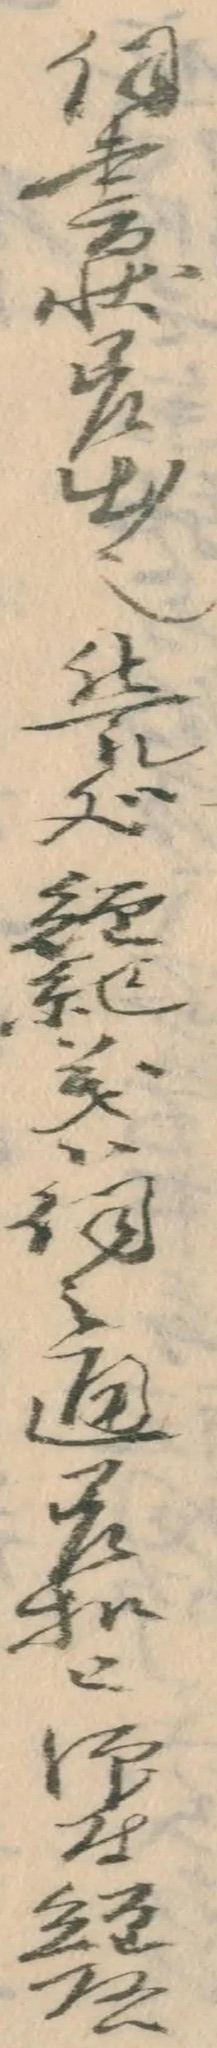伺書状差出也然ル処経紀義ハ伺之通差押被仰付経啓
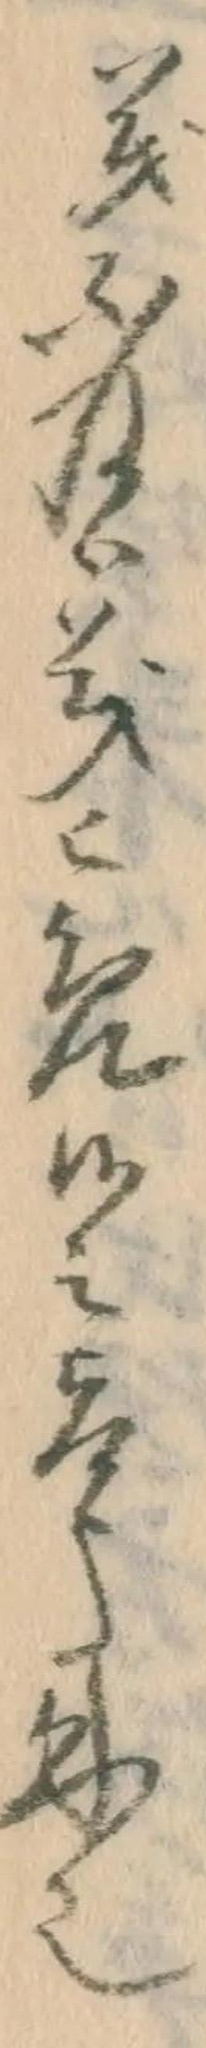義不及御義被免候之旨申来也

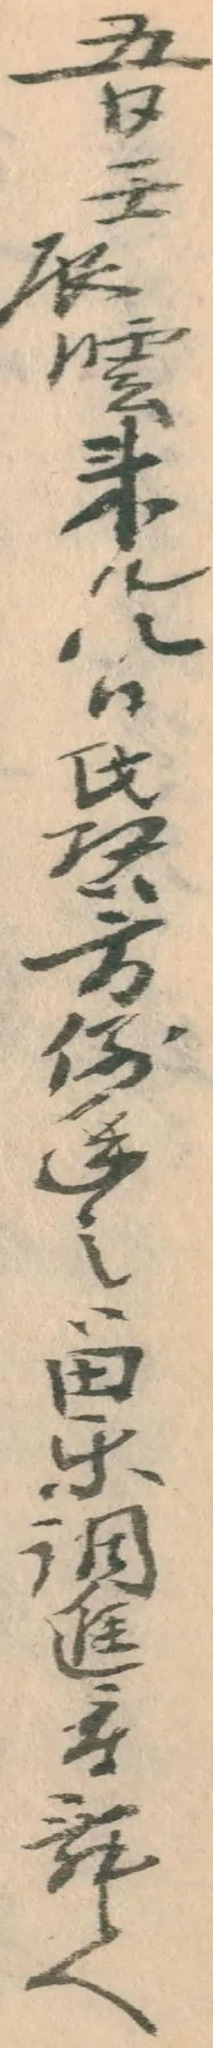五日壬辰曇来ル八日氏啓方例年之御田楽調進ニ付舞人
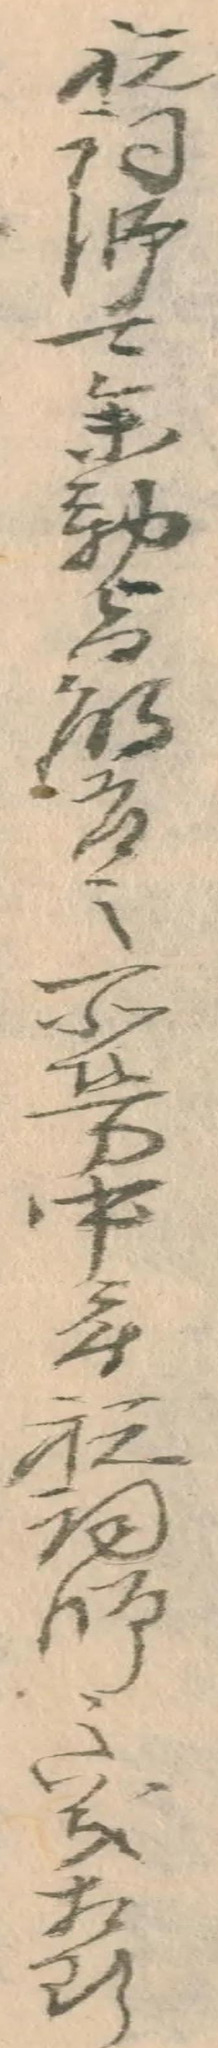祝詞師可参勤旨觸有之所労中ニ付祝詞略之義相断
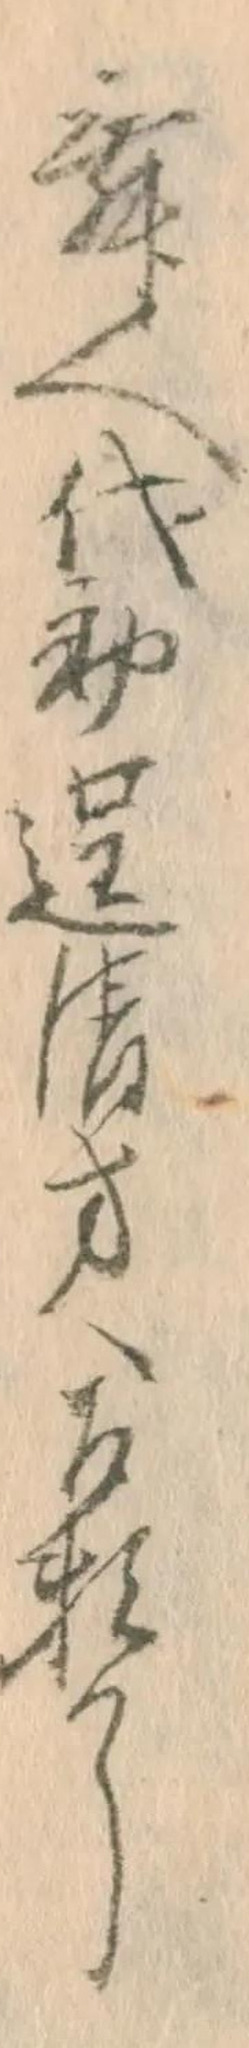舞人代勤逞清方へ相頼了
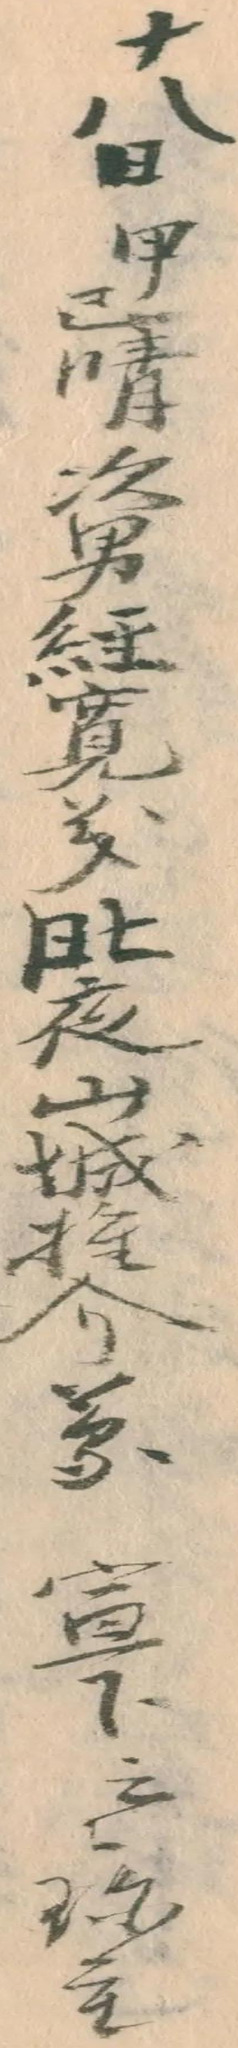十八日甲巳晴次男経寛義昨夜山城権介被宣下云々珍重
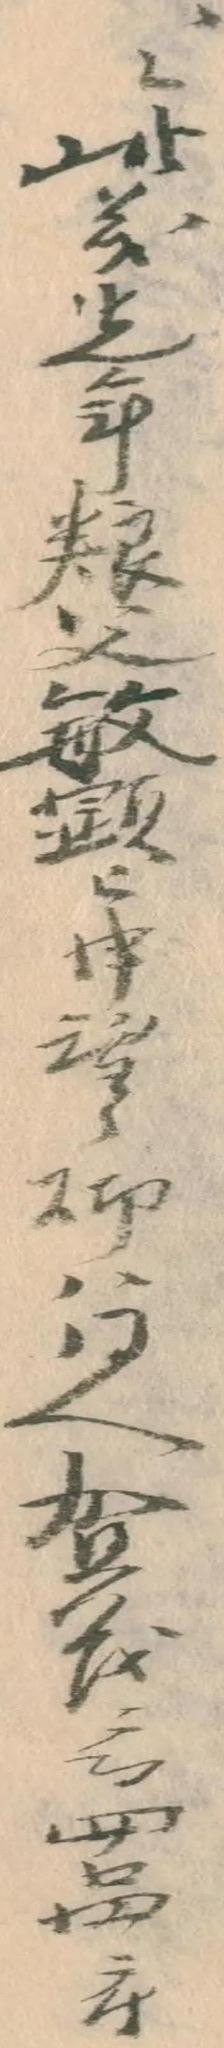々々此義先年養父敏顕と申望候砌ハ同人賀茂ニ而四品ニ付
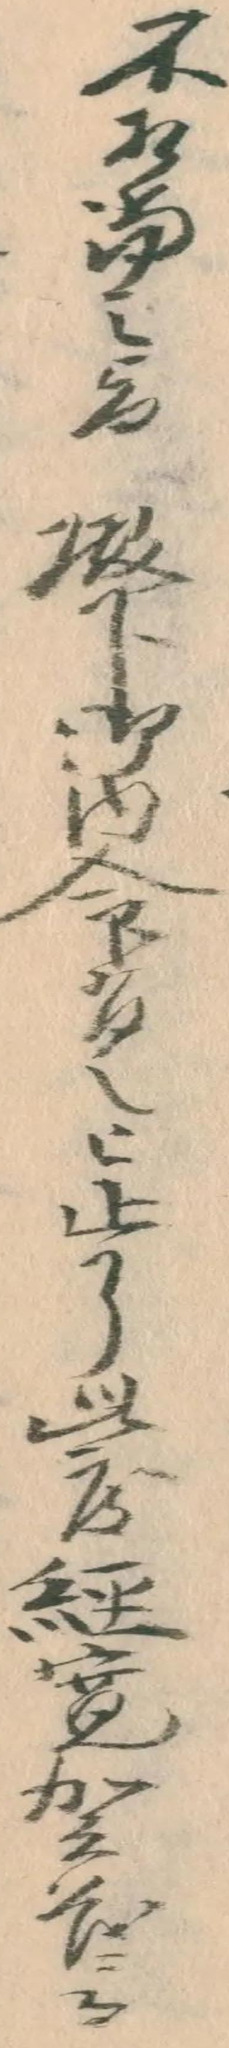不相當之旨殿下御内命有之被止了此度経寛賀茂ニ而
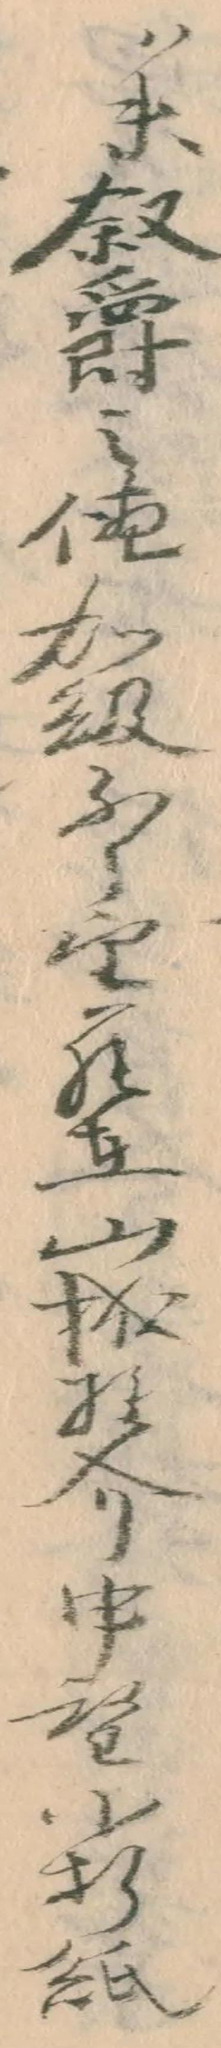ハ未叙爵之儘加級不申望罷在山城権介申望小折紙
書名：賀茂社記録. 第70冊
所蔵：国立国会図書館 National Diet Library, JAPAN
